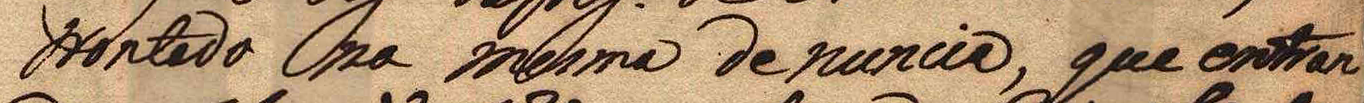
frontado na mesma denuncia, que entrar
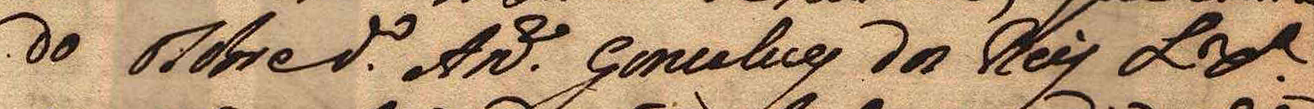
do o sobred.o Ant.o Goncalues dos Reis Lx.a
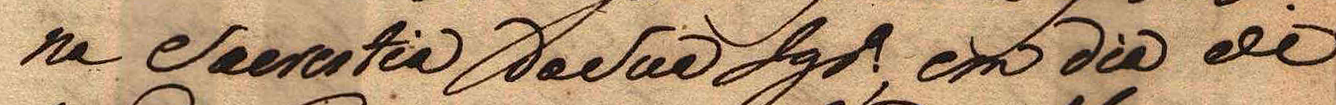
na Sacrestia da Sua Igr.a em dia de
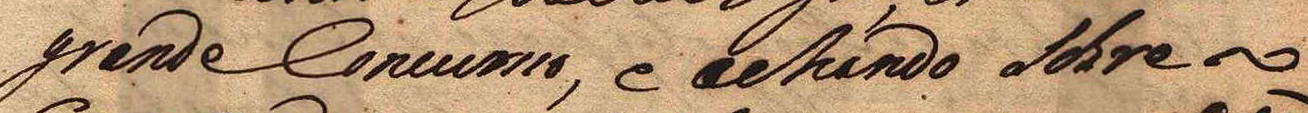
grande Concursso, e achando sobre o
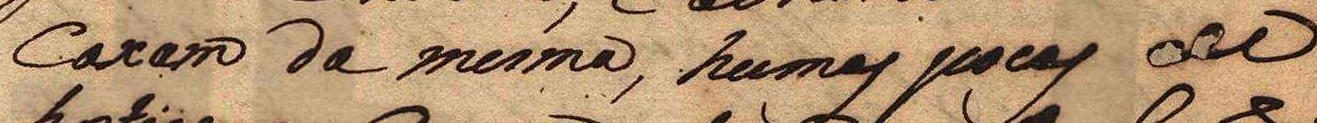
Caxam da mesma, humas pocas _e
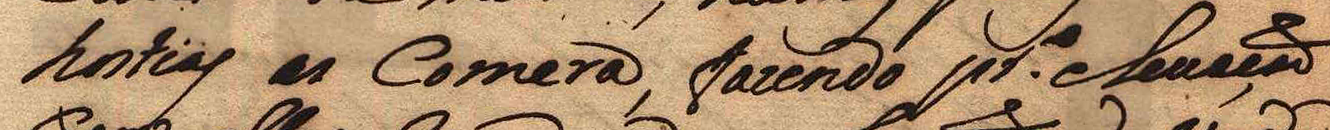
hostias as Comera, fazendo pr.o eleuação
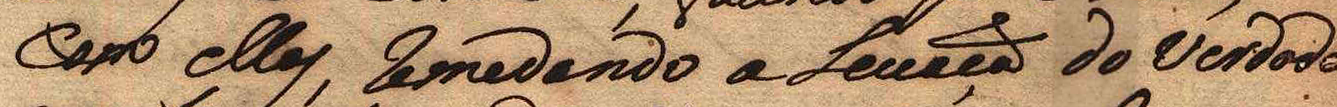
Com ellas, Remedando a Leueçaõ do verdadei
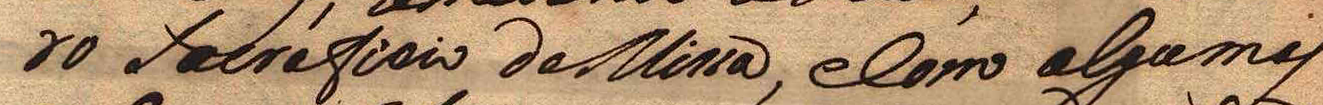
ro Sacreficio de Missa, e Com algumas
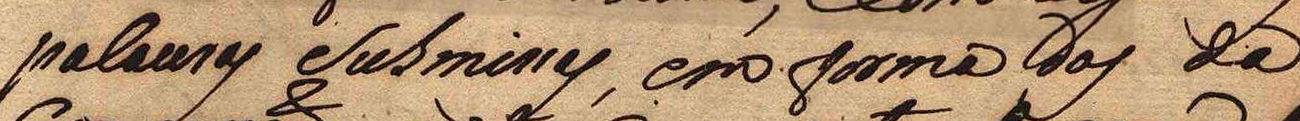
palauras Submissas, em forma das da
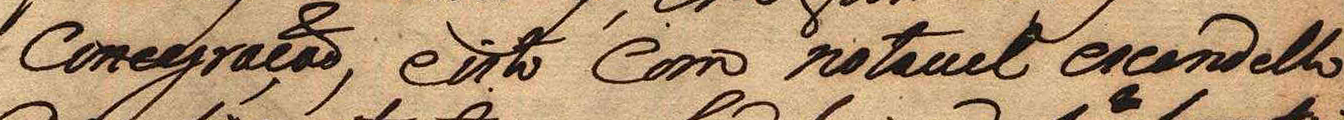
Concegração, e isto com notauel escandello
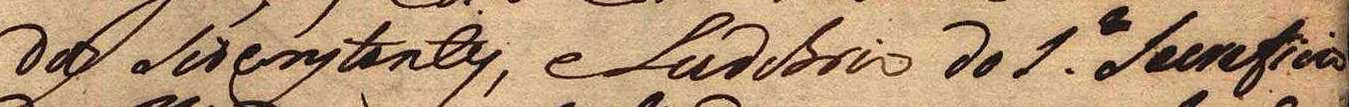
dos sirconstantes, e Ludibrio do 1.o Sacreficio
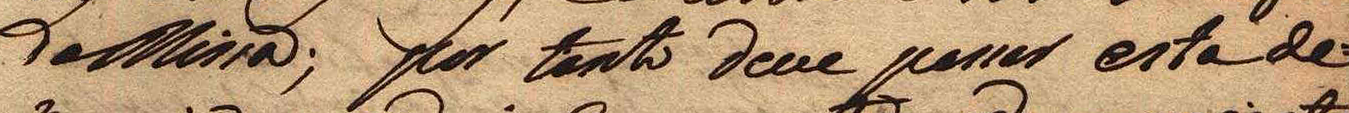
da Missa; portanto deue passer esta de
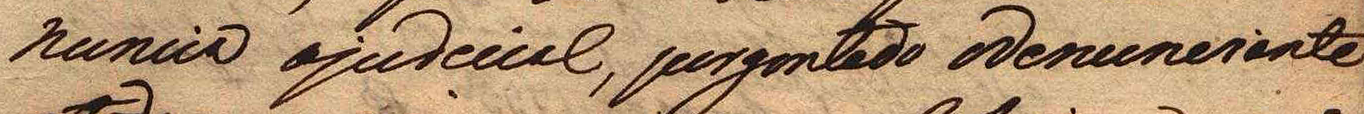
nuncia a judicial, perguntado o denunciante
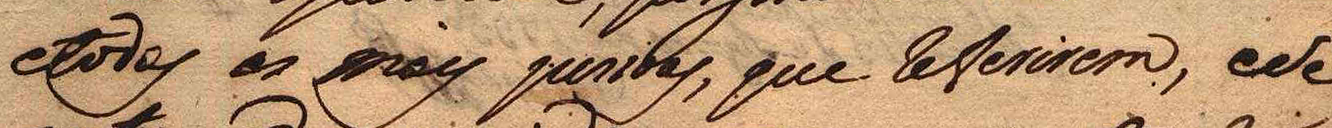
e todas as mais pessoas, que Referirem, e se
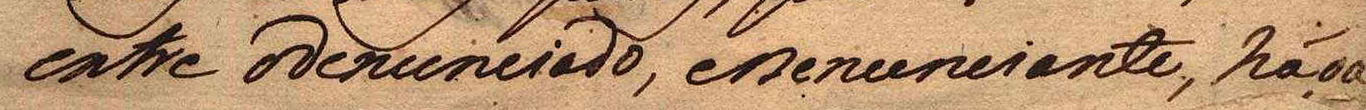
entre o denunciado, e o denunciante, naõ a
